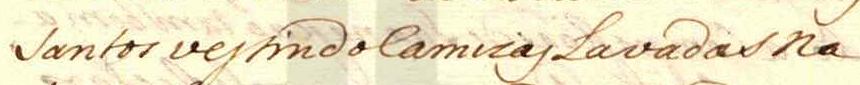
santos vestindo Camizas Lavadas na
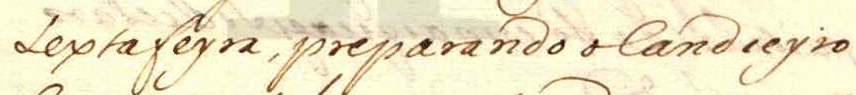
sexta feyra, preparando o Candieyro
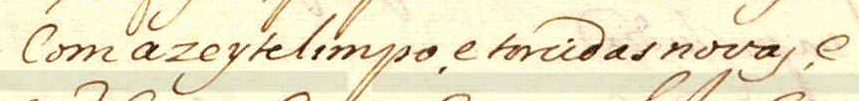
com azeyte limpo, e torcidas novas, e
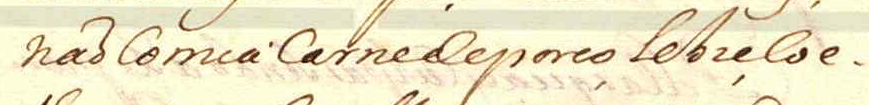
naõ Comia carne de porco, Lebre, Coe
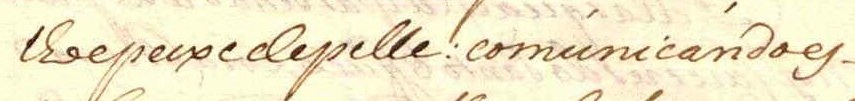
lho e peixe de pelle: comunicando es
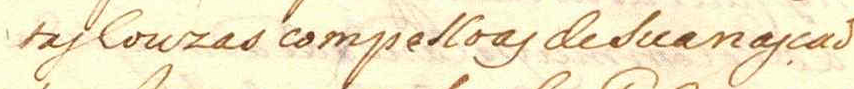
tas Couzas com pessoas de sua nasçaõ
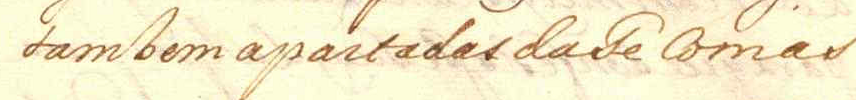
tambem apartadas da Fe com as
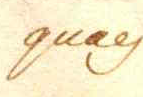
quaes
